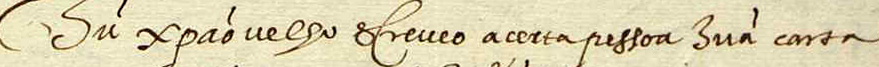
hū Xpaõ uelho esCreueo a certa pessoa huā carta
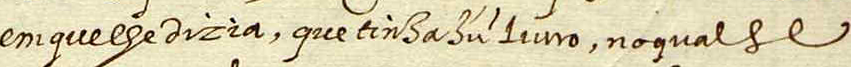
em que lhe dizia, que tinha hū liuro, no qual se
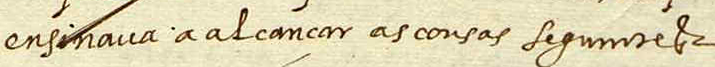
ensinaua a alcançar as cousas seguintes
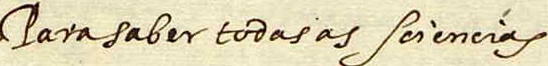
Para saber todas as sciencias
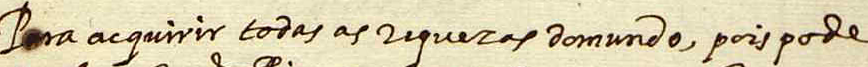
Para acquirir todas as riquezas do mundo, pois pode
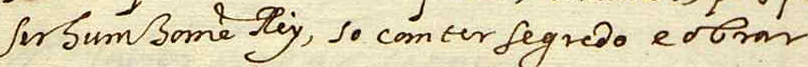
ser hum homē Rey, so com ter segredo e obrar
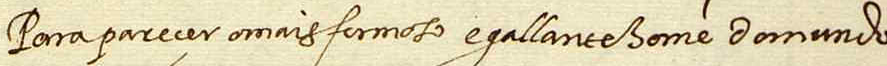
Para parecer o mais fermoso e gallante homē do mundo
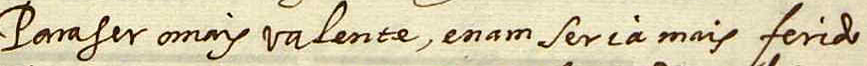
Para ser o mais valente, e nam ser iamais ferido
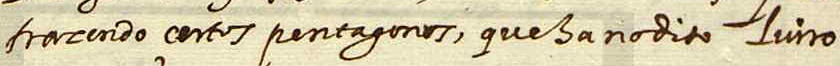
trazendo certos pentagonos, que ha no dito Liuro
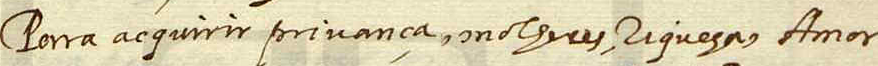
Para acquirir priuança, molheres, Riqueza, Amor
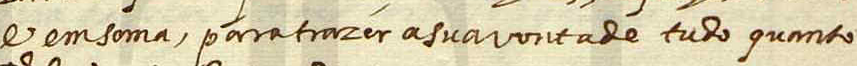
e em soma, para trazer a sua vontade tudo quanto
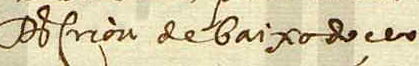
Ds̄ Criou debaixo do ceo
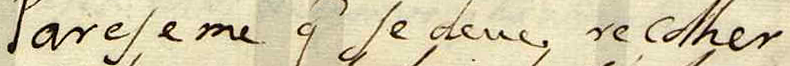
Pareseme q̄ se deue recolher
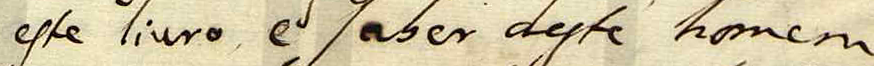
este liuro, e saber deste homem
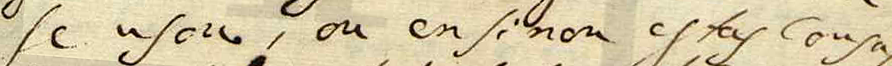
se usou, ou ensinou estas cousas
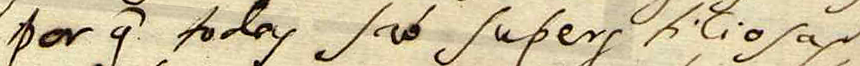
porq̄ todas saõ supersticiosas,
